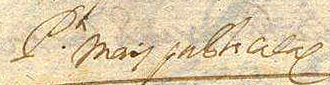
P.a mais publicaçaõ
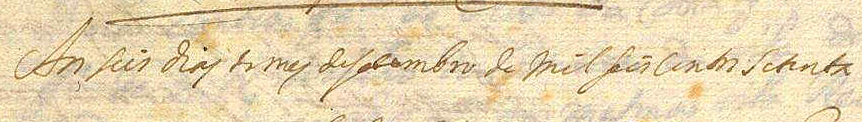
Aos seis dias do mes de setembro de mil seiscentos setenta
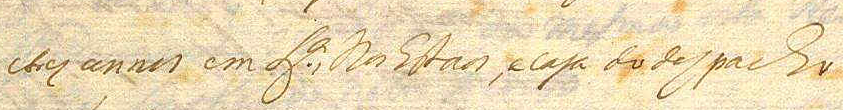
e tres annos em Lx.a nos Estaos, e casa do despacho
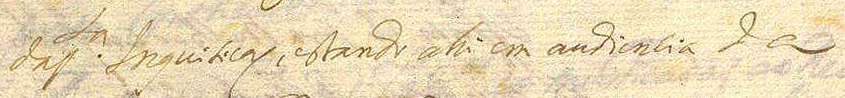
da s.ta Inquisiçaõ, estando ahi em audiencia da
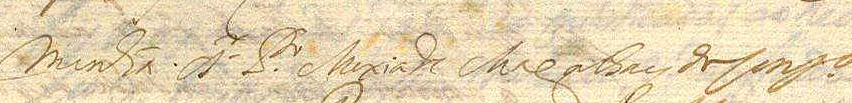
menhā o s.r P.o Mexia de Magalhaes do Cons.o
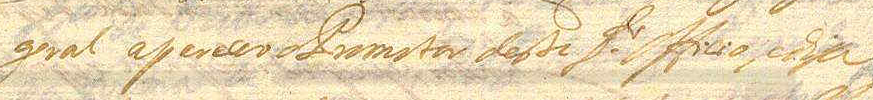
geral apareceo o Promotor deste s.to Officio, e disse
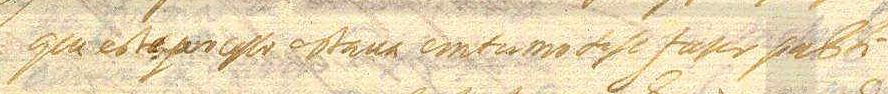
que este presso estaua em termo de se fazer publi
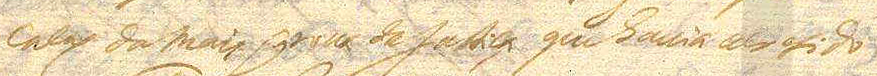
caçaõ da mais proua da Justiça que hauia acresido
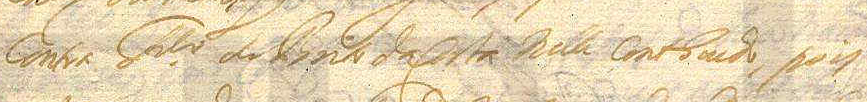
Contra Fr.co de Brito da Costa nella contheudo, pois
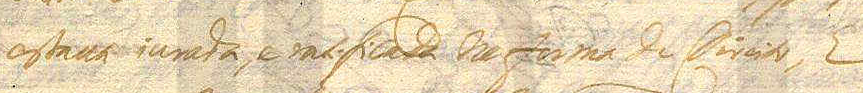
estaua iurada, e ratificada na forma de Direito, E
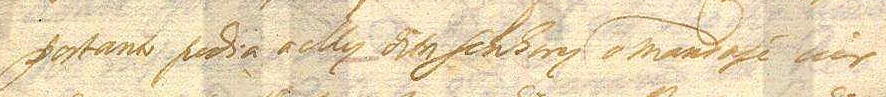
portanto pedia a elles ditos senhores o mandasē uir
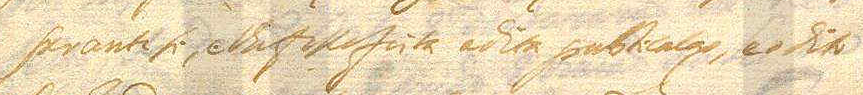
perante si, e lhe fosse feita a dita publicaçaõ, e o dito
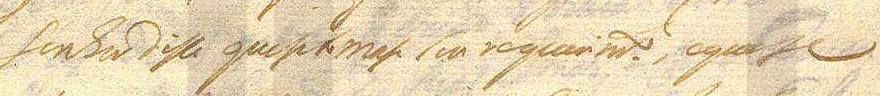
senhor disse que se tomase seu requerim.to, e que se
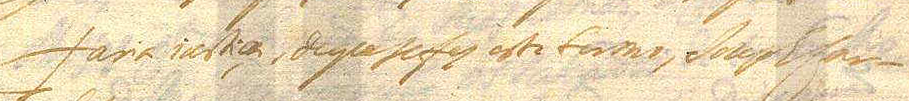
fara iustiça, de que se fes este termo, Jozeph Car
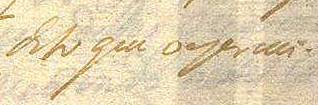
doso que o escreui.
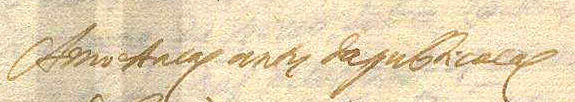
Amoestaçaõ antes da publicaçaõ
